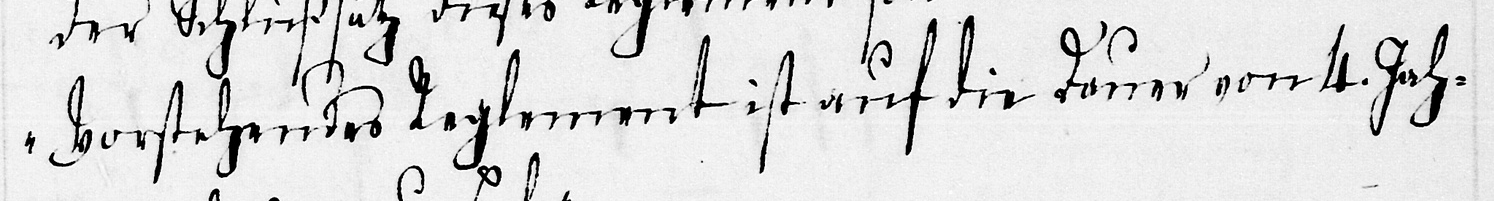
„Vorstehendes Reglement ist auf die Dauer von 4. Jah¬
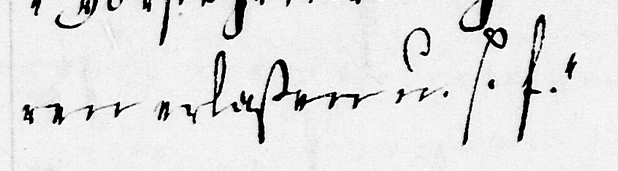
ren erlaßen u. s. f.“
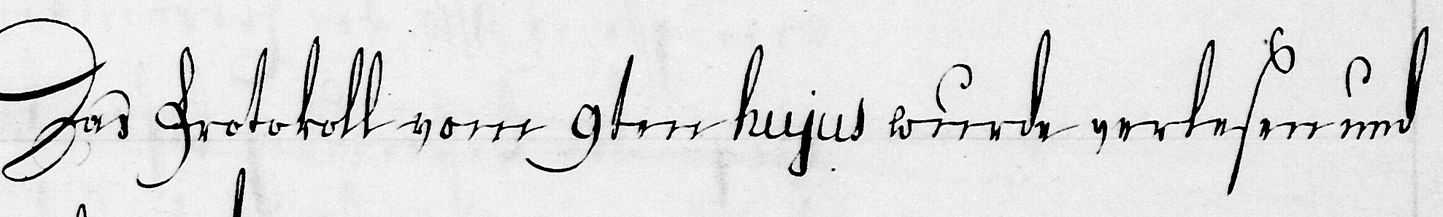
Das Protokoll vom 9ten hujus wurde verlesen und
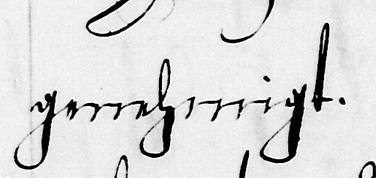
genehmigt.
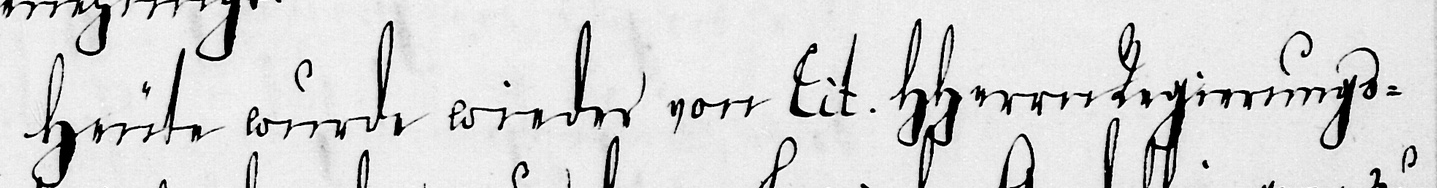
Heute wurde wieder von Tit. HHerrn Regierungs¬
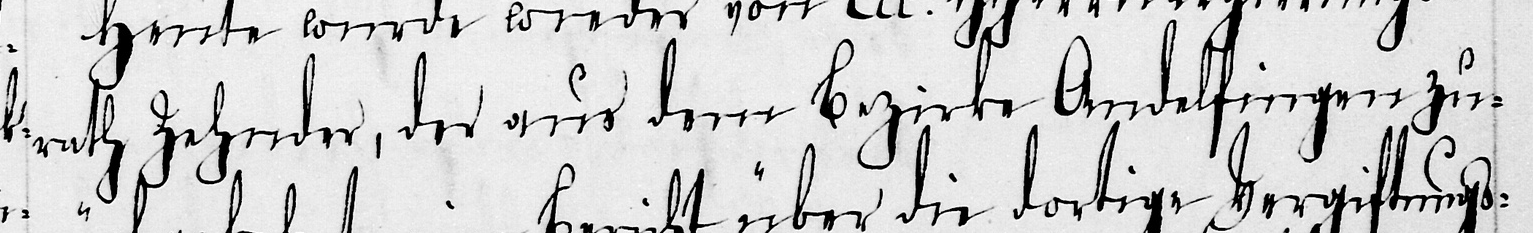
rath Zehnder, der aus dem Bezirke Andelfingen zu¬
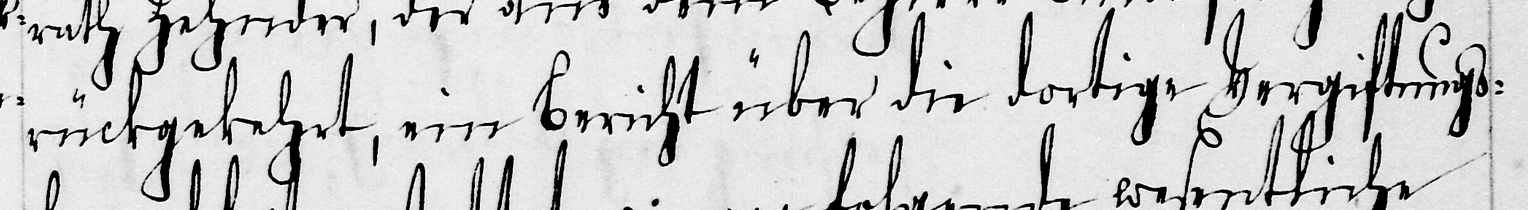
rückgekehrt, ein Bericht über die dortige Vergiftungs¬
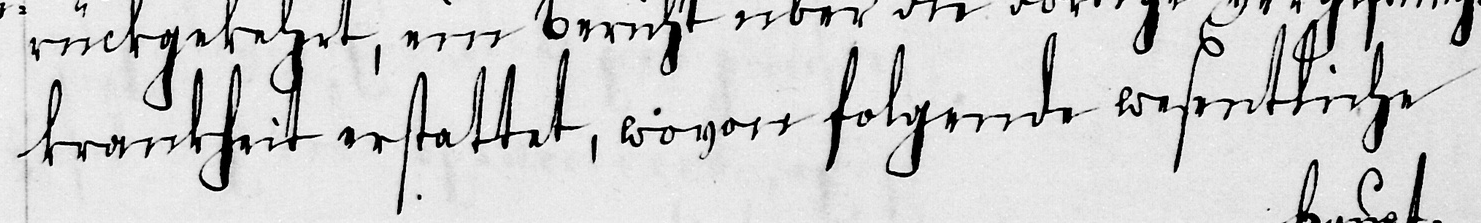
krankheit erstattet, wovon folgende wesentliche
